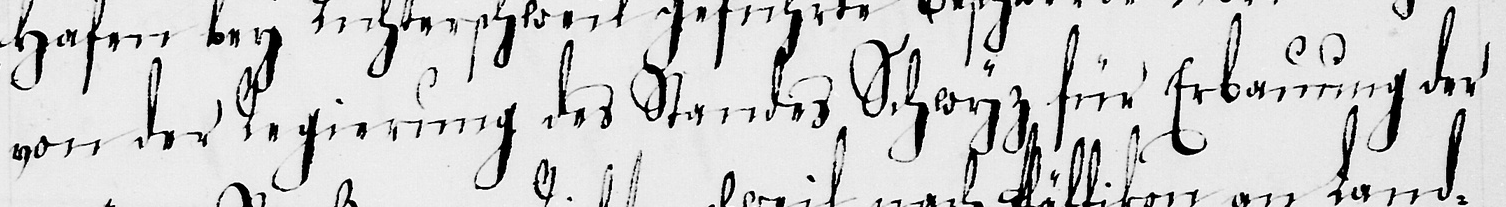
von der Regierung des Standes Schwyz für Erbauung der
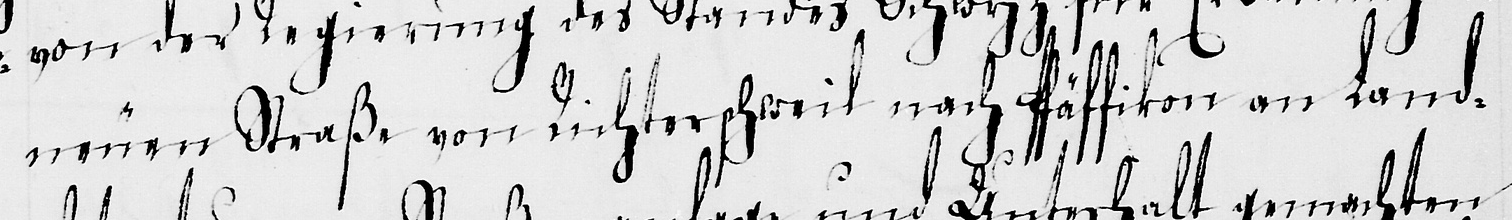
neuen Straße von Richterschweil nach Pfäffikon an Land¬
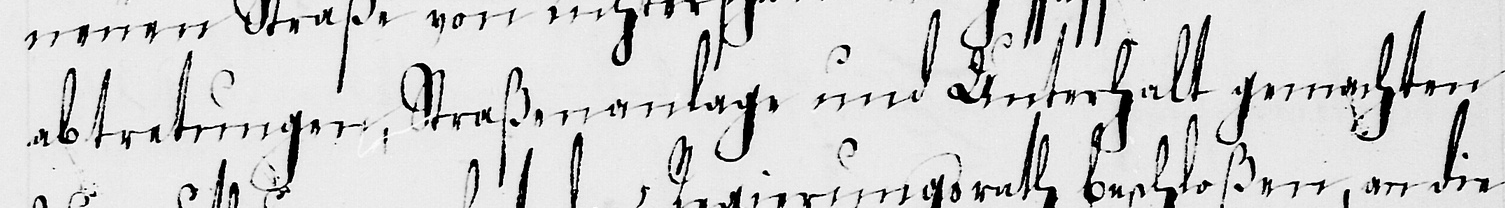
abtretungen, Straßenanlage und Unterhalt gemachten
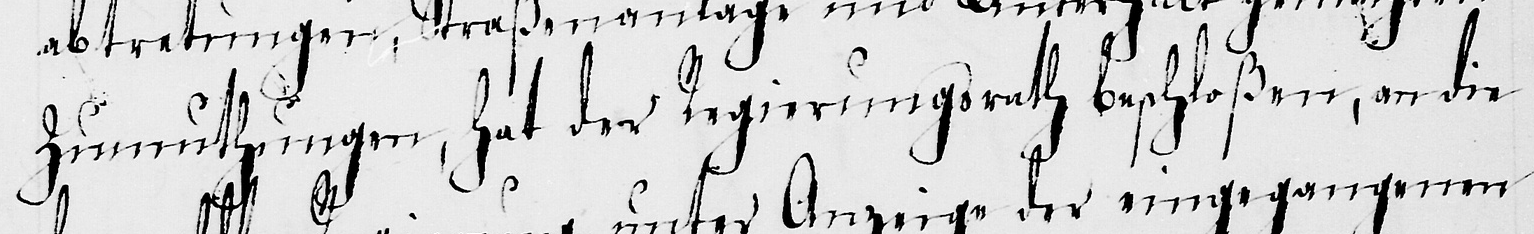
Zumuthungen, hat der Regierungsrath beschloßen, an die
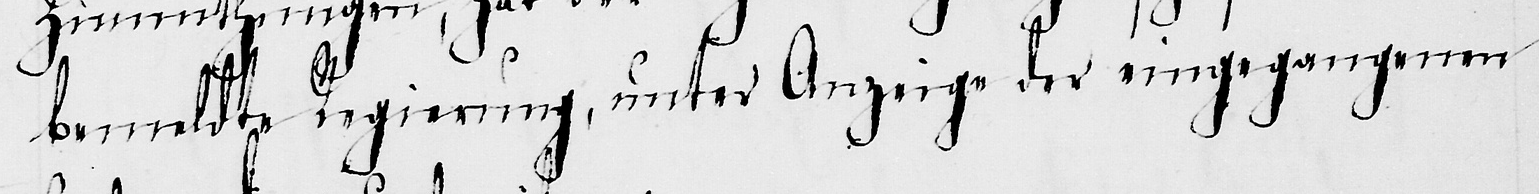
bemeldte Regierung, unter Anzeige der eingegangenen
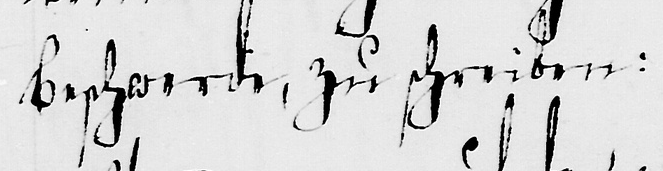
Beschwerde, zu schreiben:
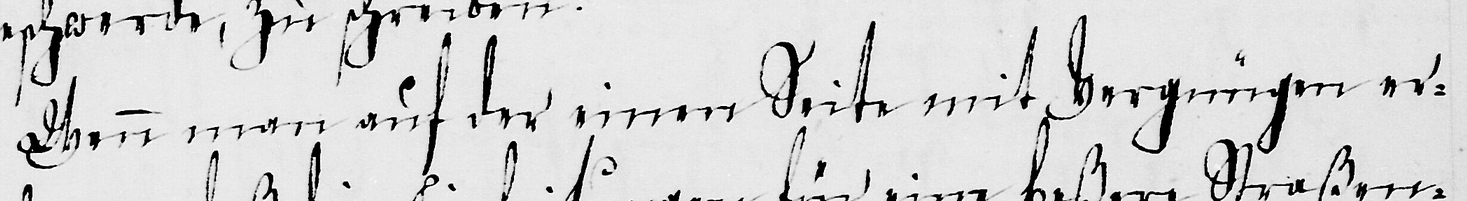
Wenn man auf der einen Seite mit Vergnügen er¬
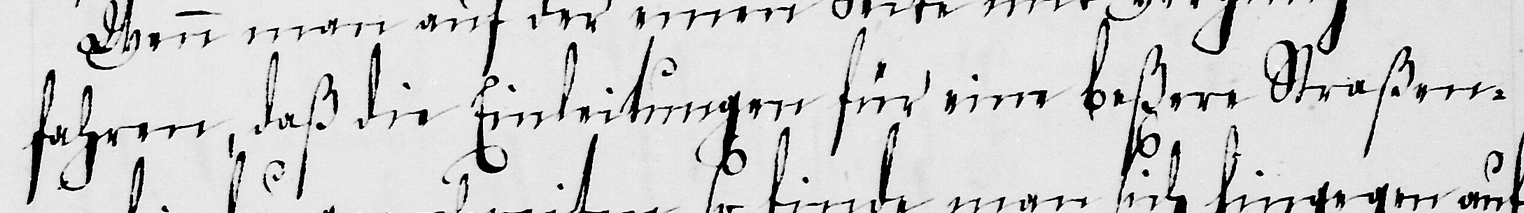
fahren, daß die Einleitungen für eine beßere Straßen¬
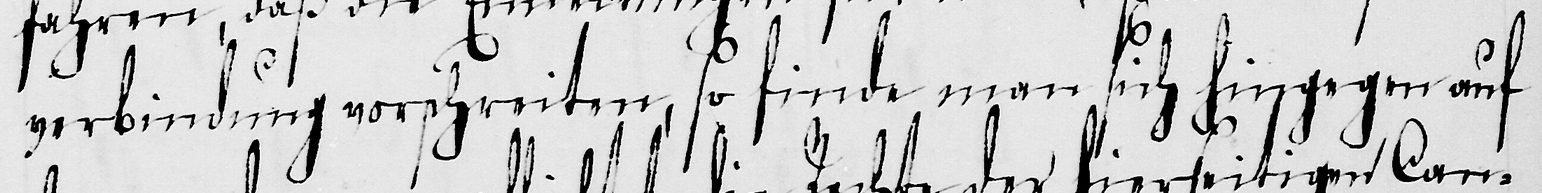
verbindung vorschreiten, so finde man sich hingegen auf
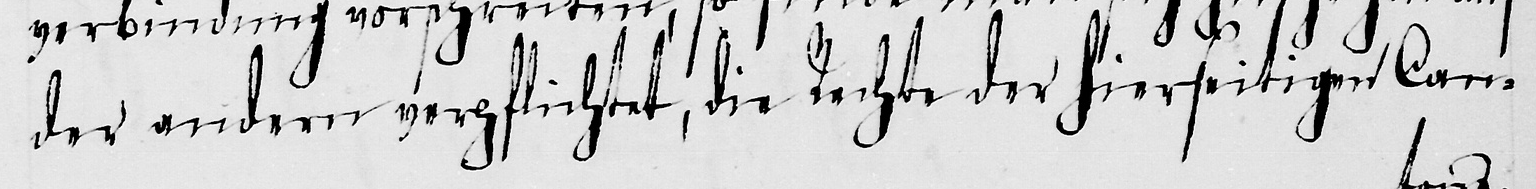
der andern verpflichtet, die Rechte der hierseitigen Can-
